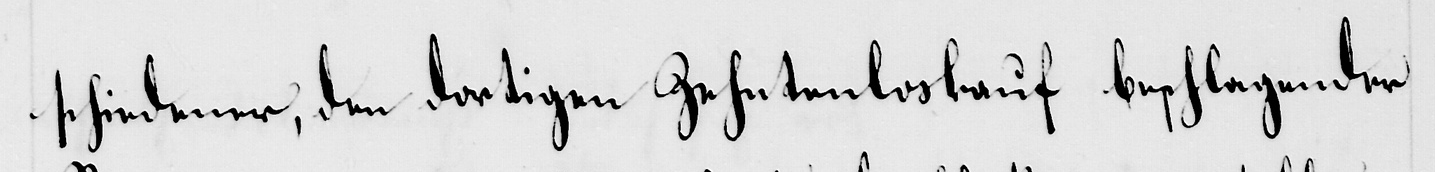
schiedener, den dortigen Zehntenloskauf beschlagender
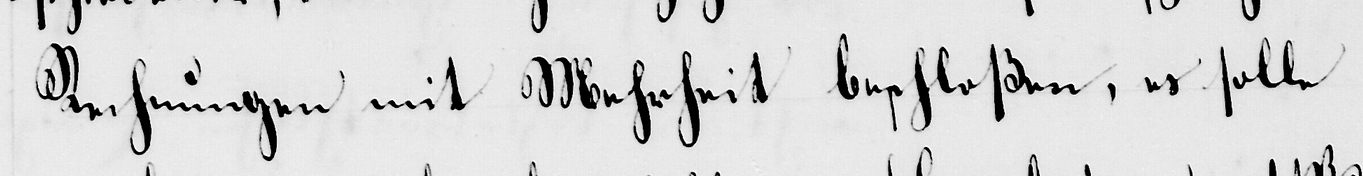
Rechnungen mit Mehrheit beschloßen, es solle
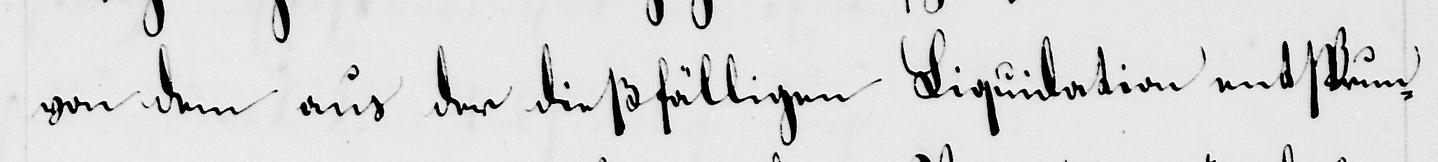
von dem aus der dießfälligen Liquidation entsprun¬
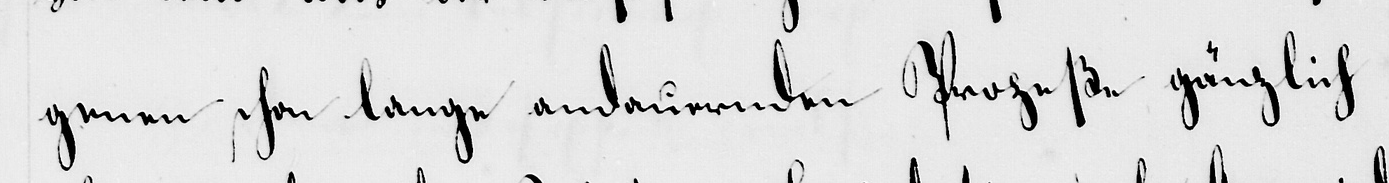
genen schon lange andauernden Prozeße gänzlich
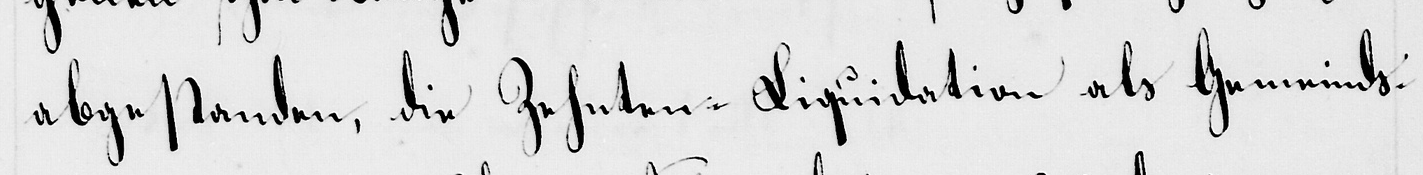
abgestanden, die Zehnten-Liquidation als Gemeinds¬
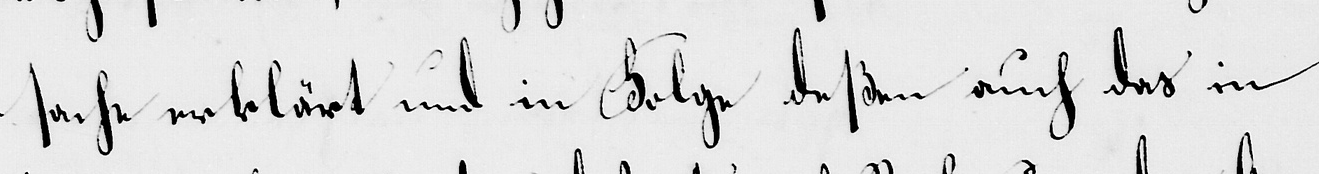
sache erklärt und in Folge deßen auch das in
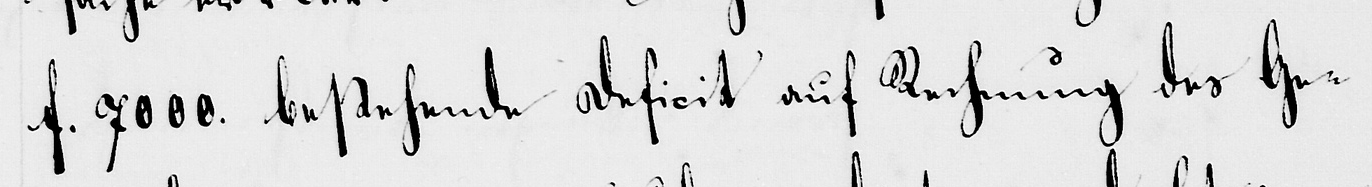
F. 7000. bestehende Deficit auf Rechnung des Ge¬
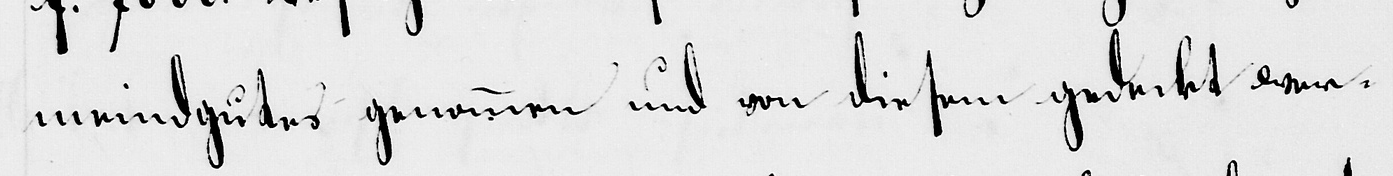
meindgutes genommen und von diesem gedeckt wer¬
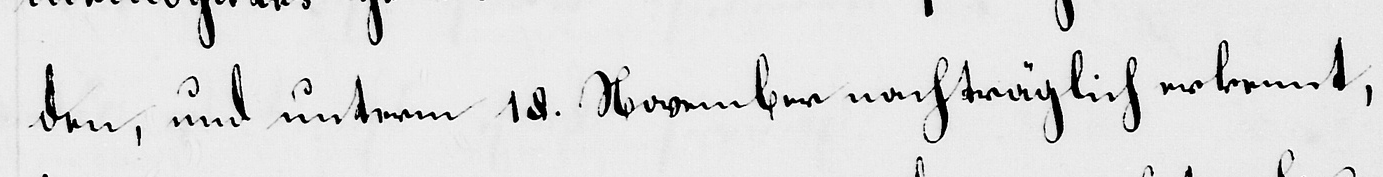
den, und unterm 18. November nachträglich erkannt,
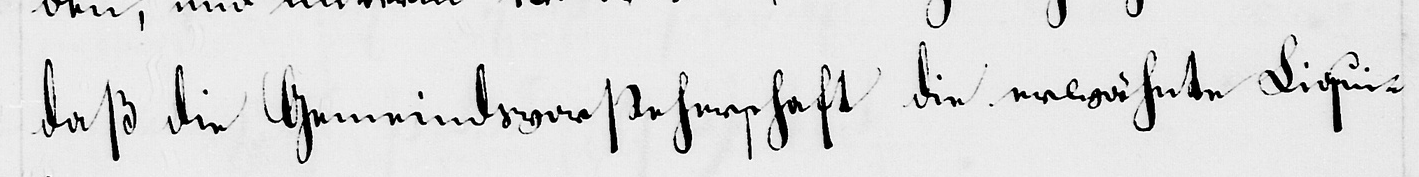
daß die Gemeindsvorsteherschaft die erwähnte Liqui¬
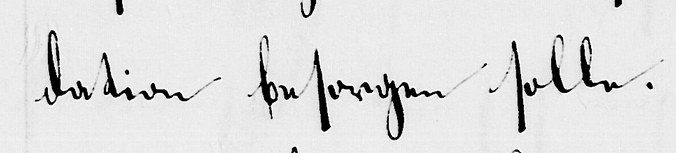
dation besorgen solle.
